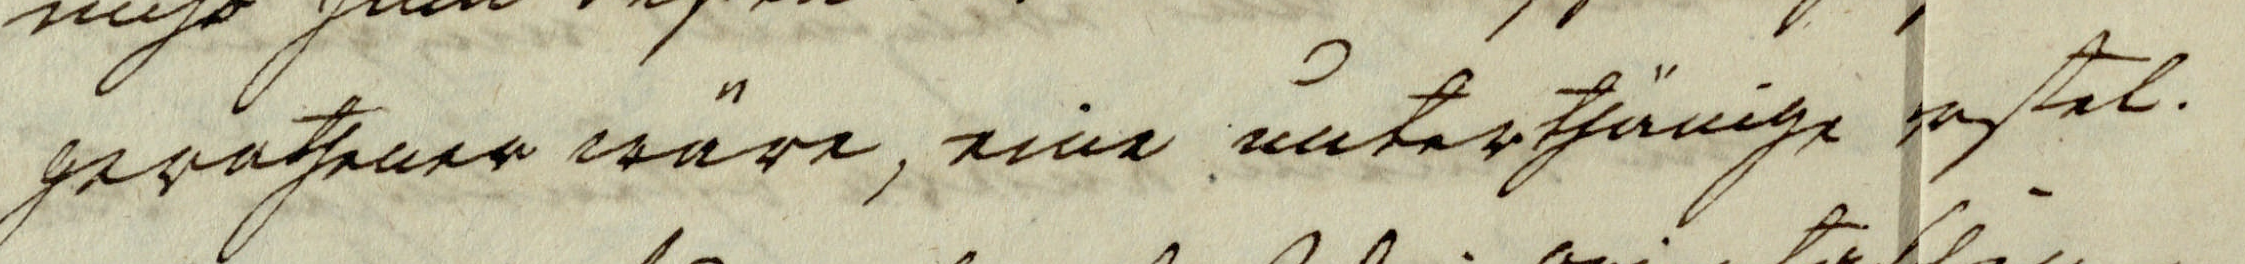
gerathen wäre, eine unterthänige xxx
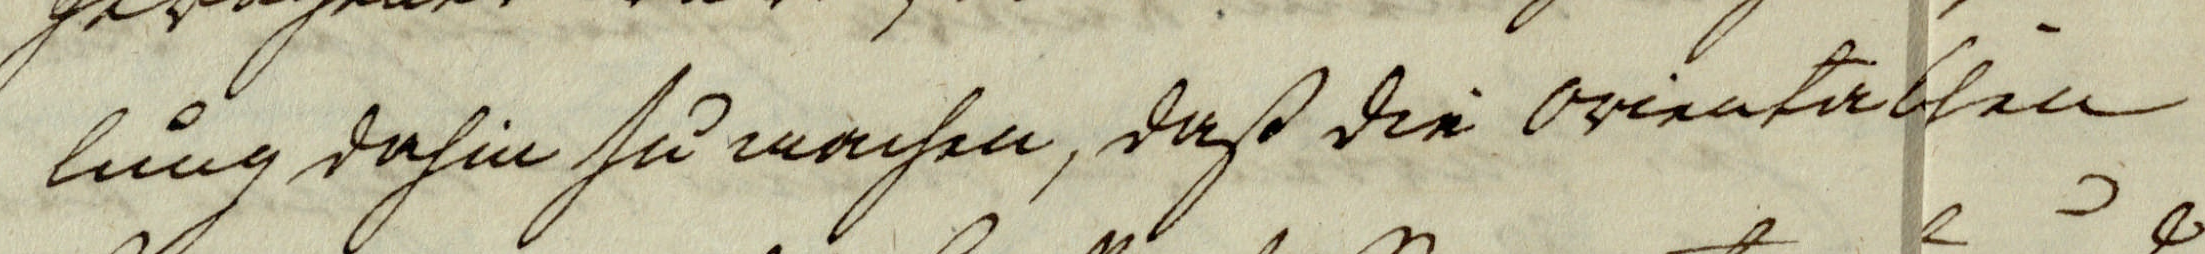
lung dahin zu machen, daß die Orientalischen
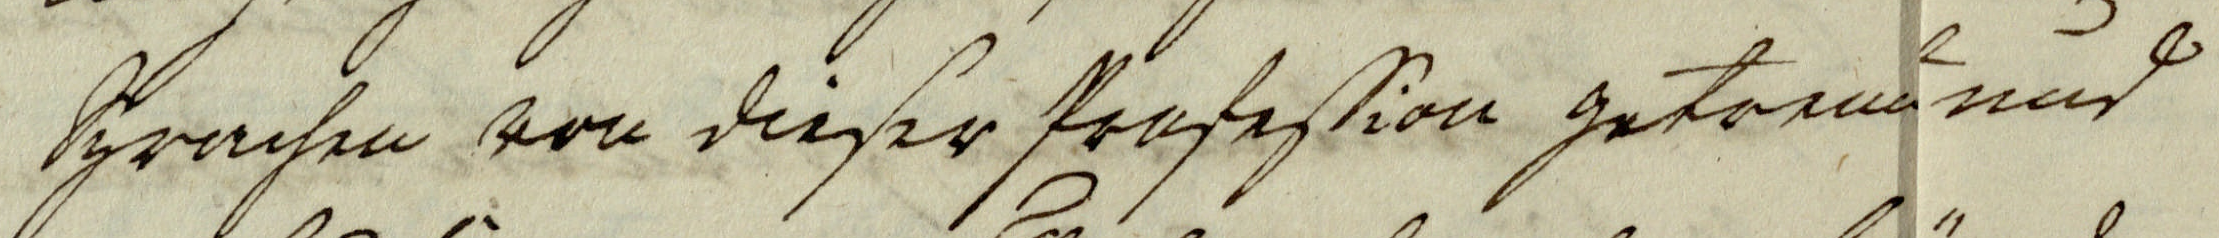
Sprachen von dieser Profession getrennt und
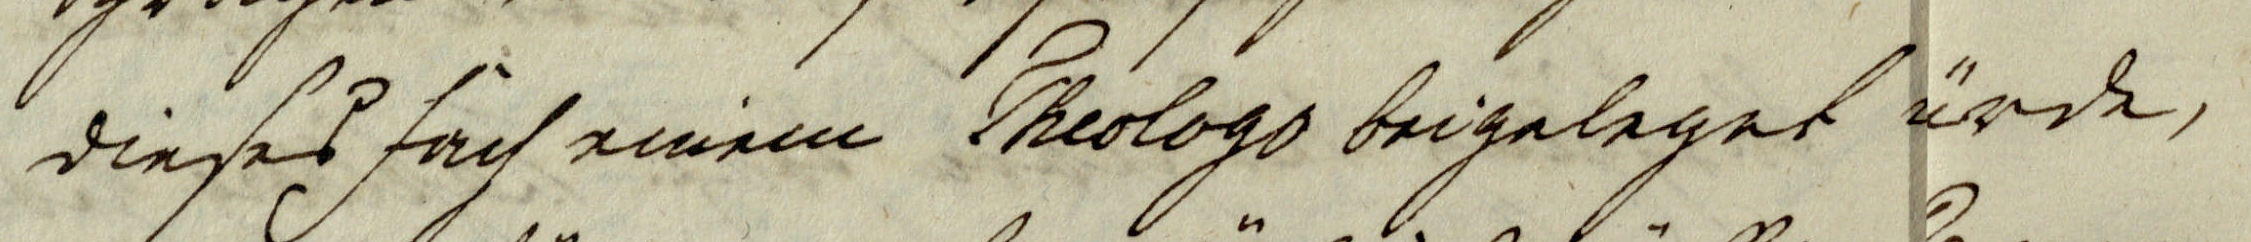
dieses Fach einem Theologo beigeleget würde,
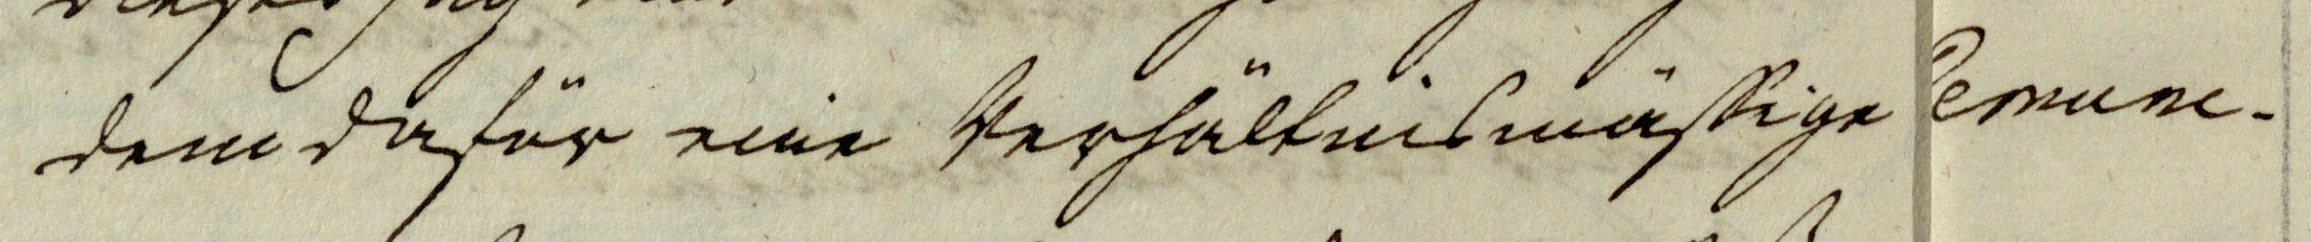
dem dafür eine verhältnismässige Remune¬
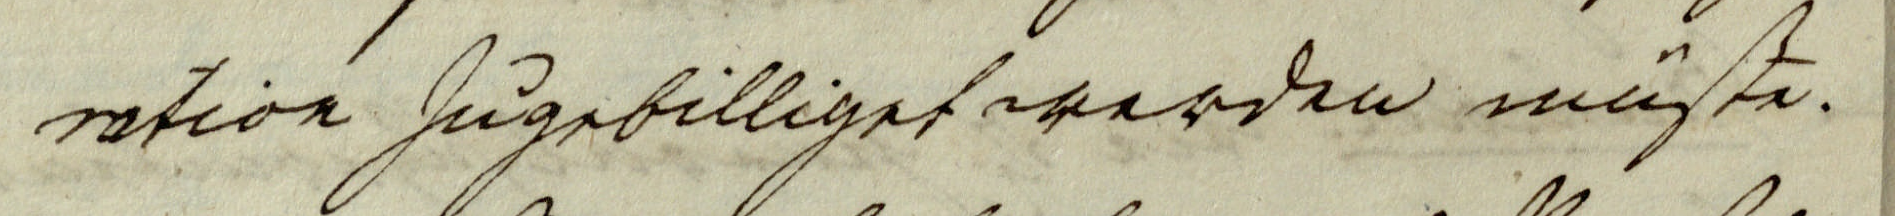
ration zugebilligt werden müßte.
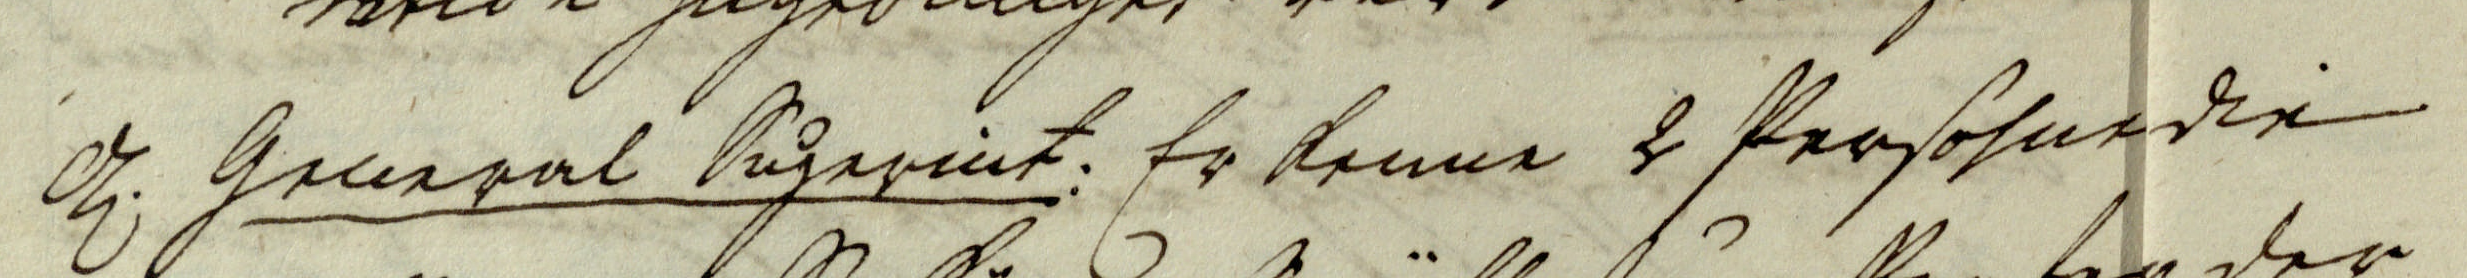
dh. General Superint: Er kenne 2 Professoren die
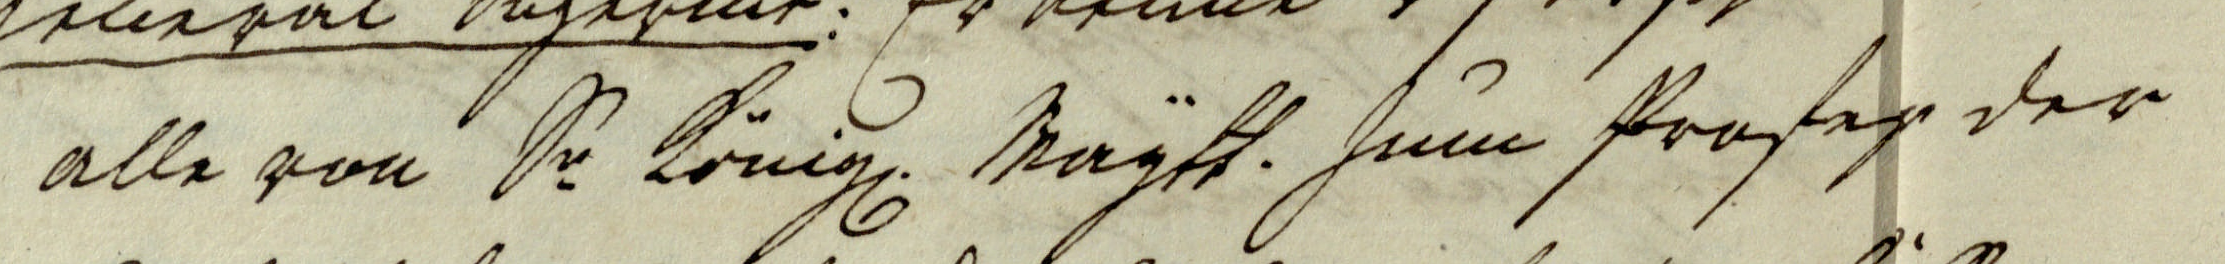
alle von Sr. Königl. Maÿst. zum Professor der
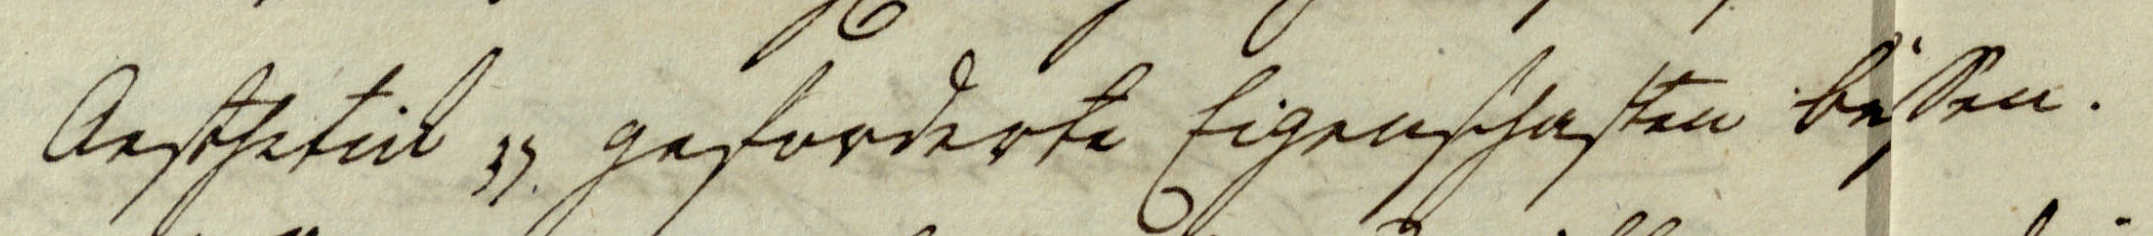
Aesthetick geforderte Eigenschaften besässen.
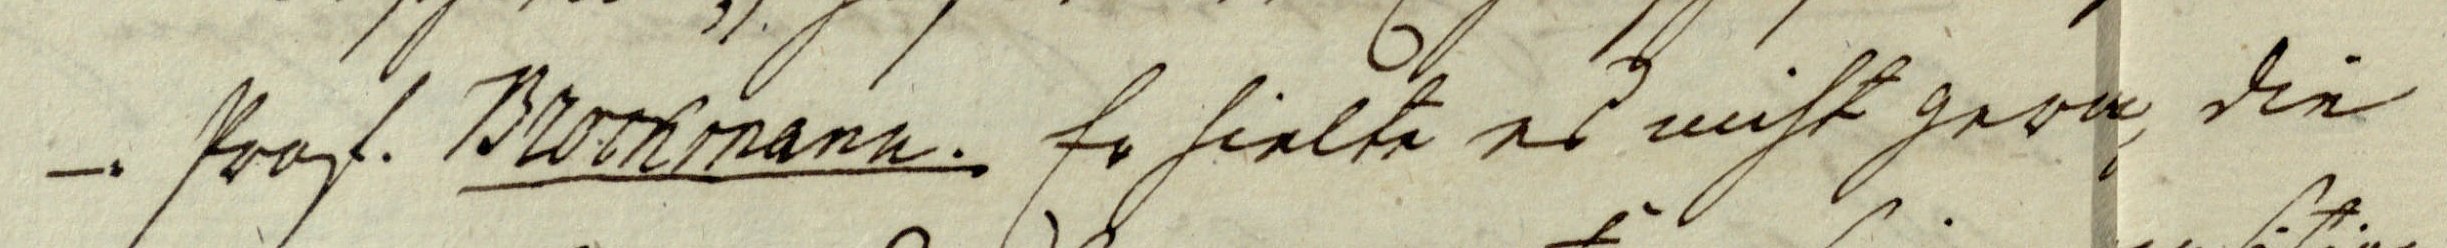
— . Prof. Brockmann. Er hielte es nicht gerathen, die
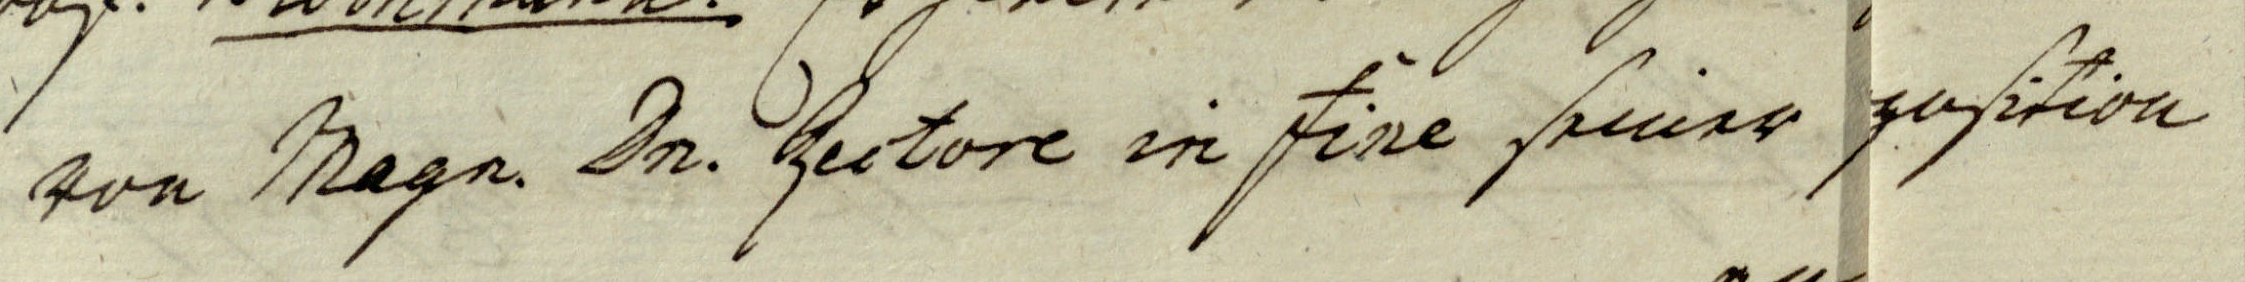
von Magn. Dn. Rectore in fine seiner Proposition
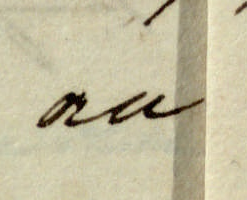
an¬
